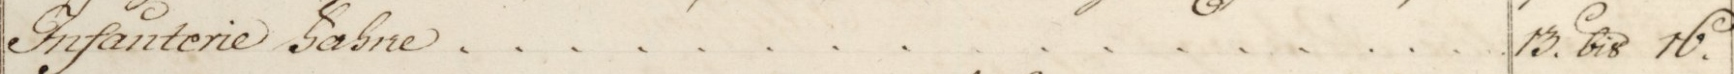Infanterie Fahne. 13. bis 16.
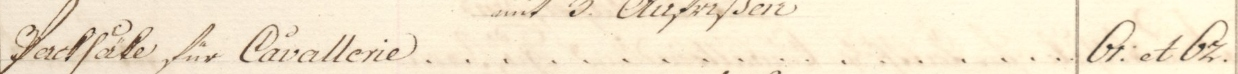Packsäke für Cavallerie. 61. et 62.
